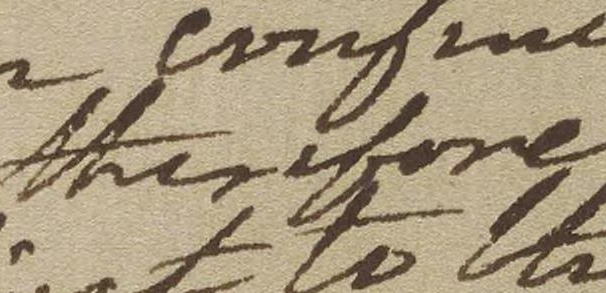therefore
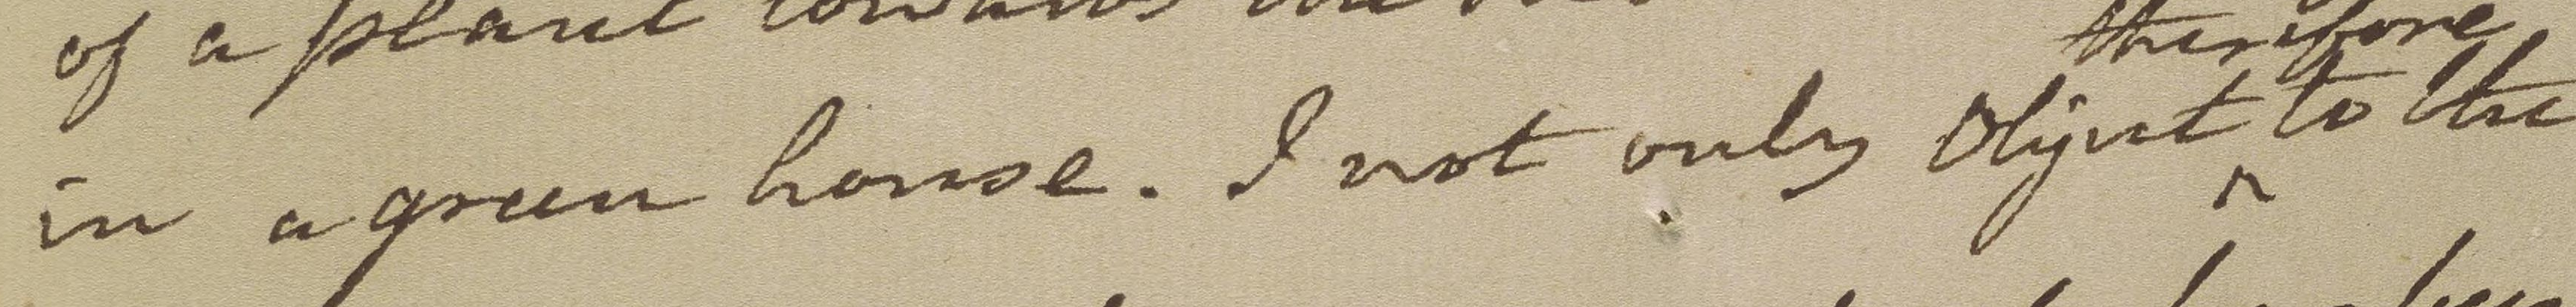in a green house. I not only object ^ to the
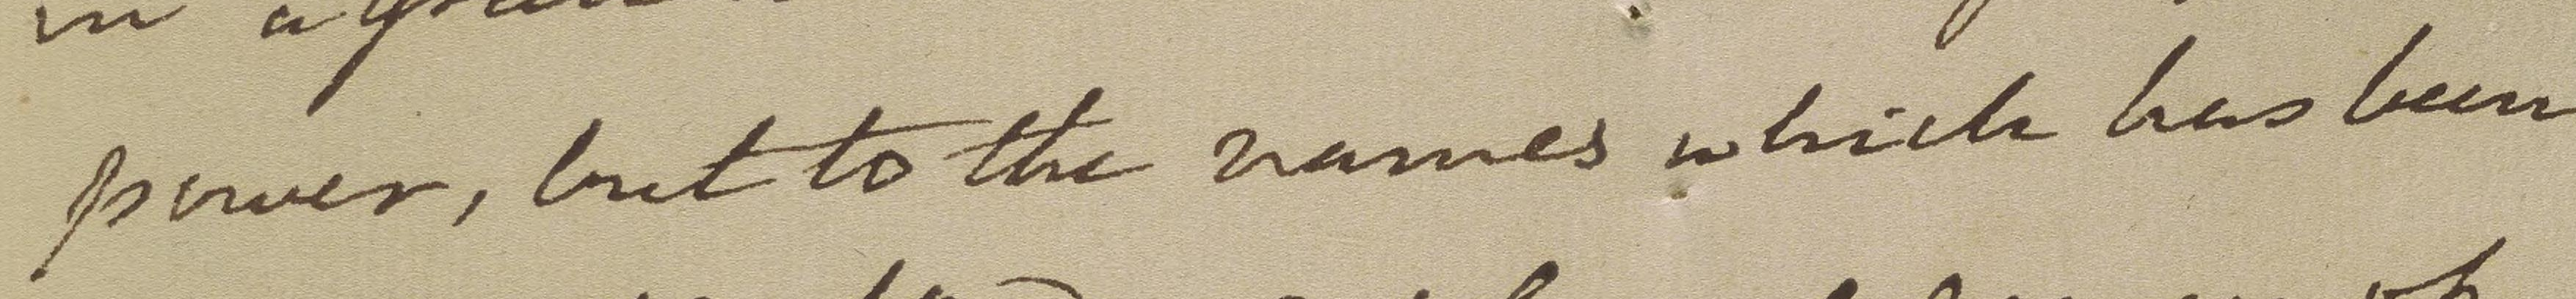power, but to the names which has been
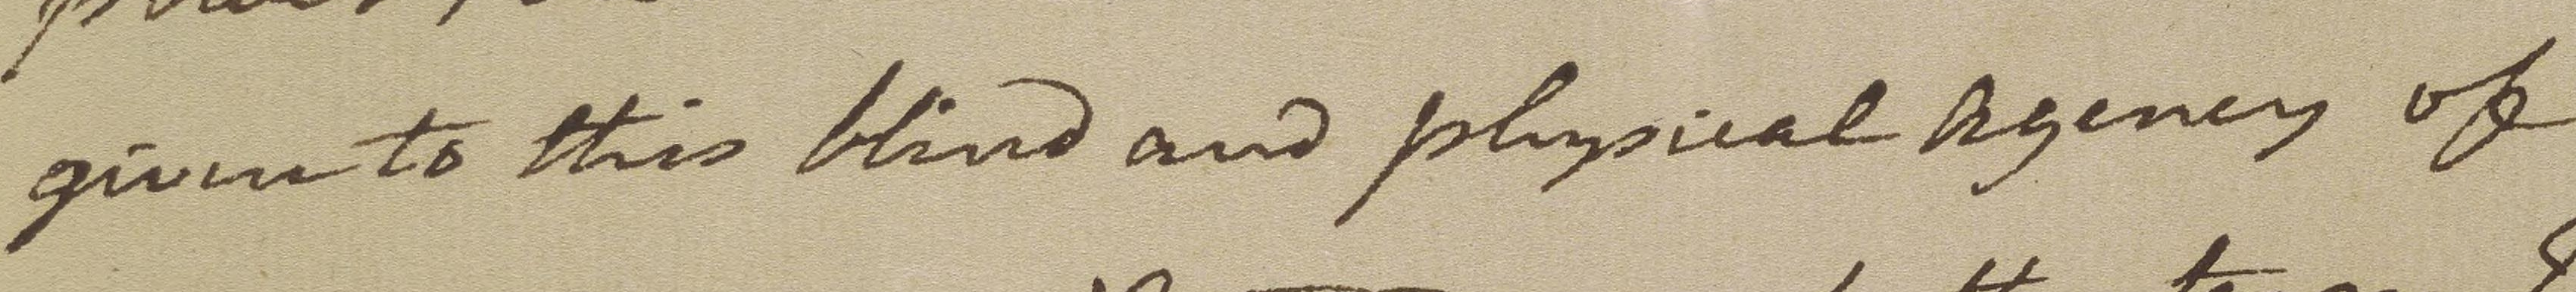given to this blind and physical agency of
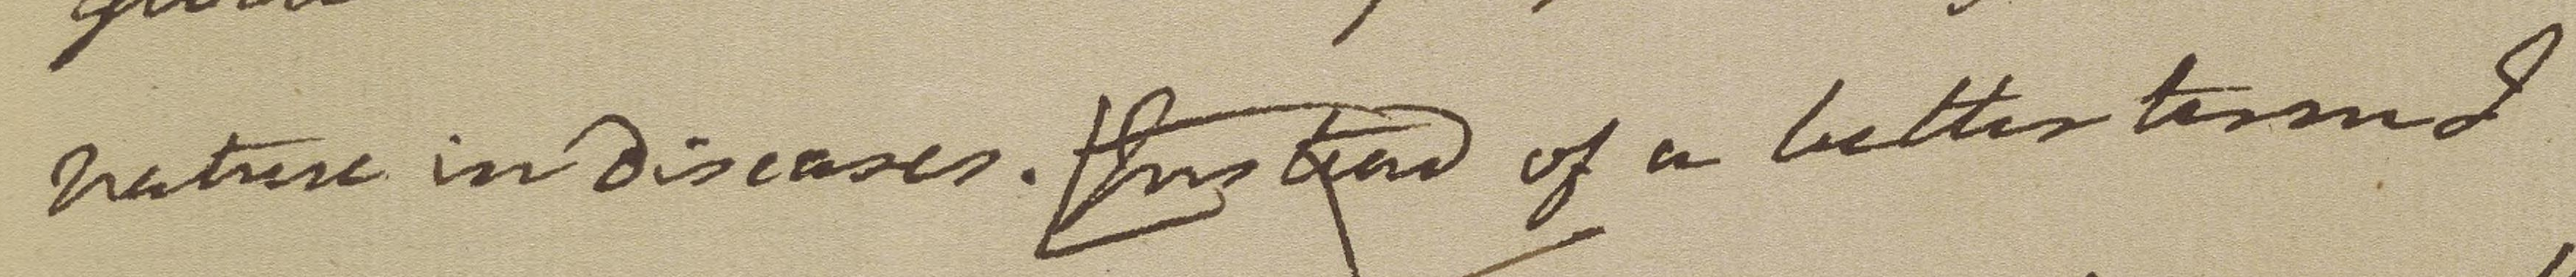nature in diseases. (Instead of a better term I
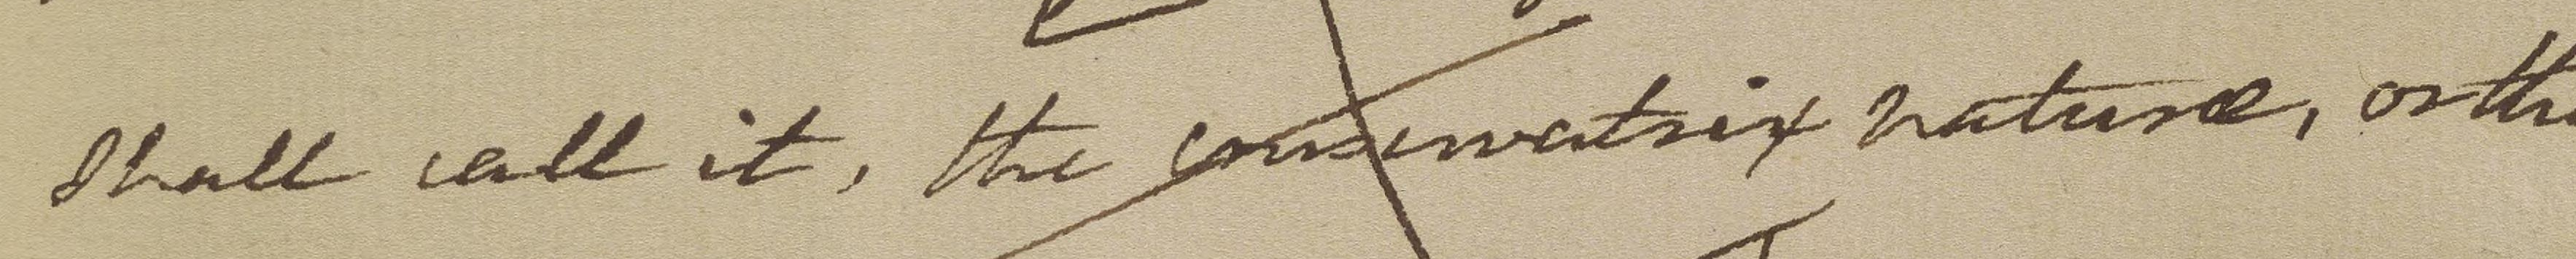shall call it, the conservatrix nature, or the
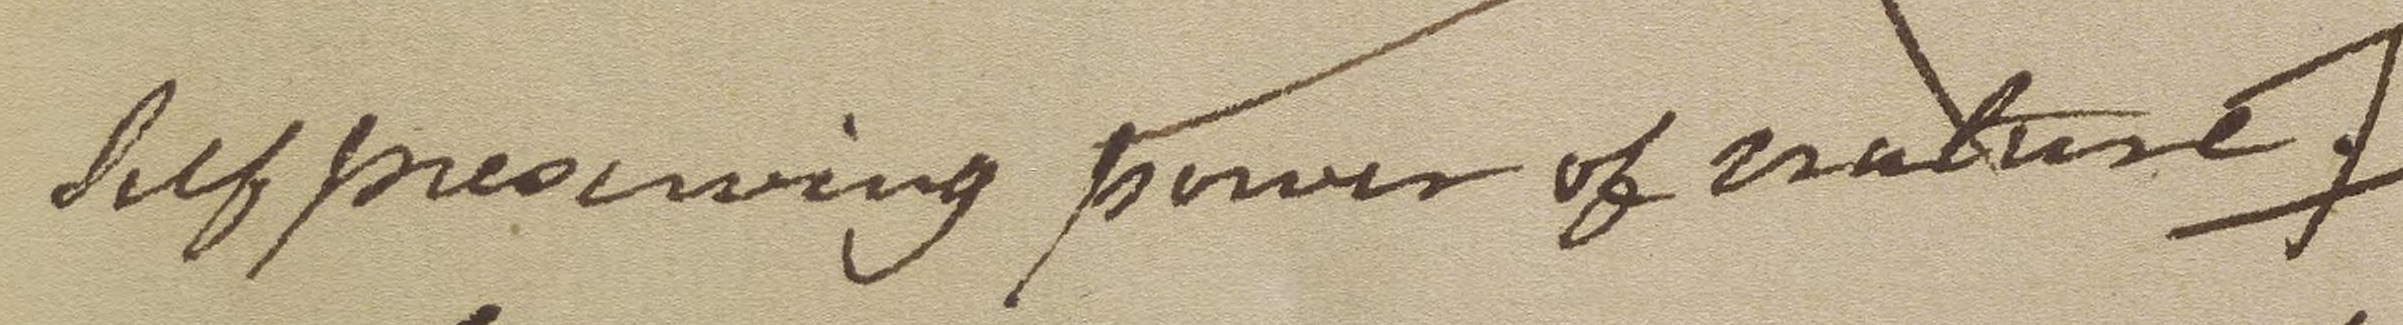self preserving power of nature.)
